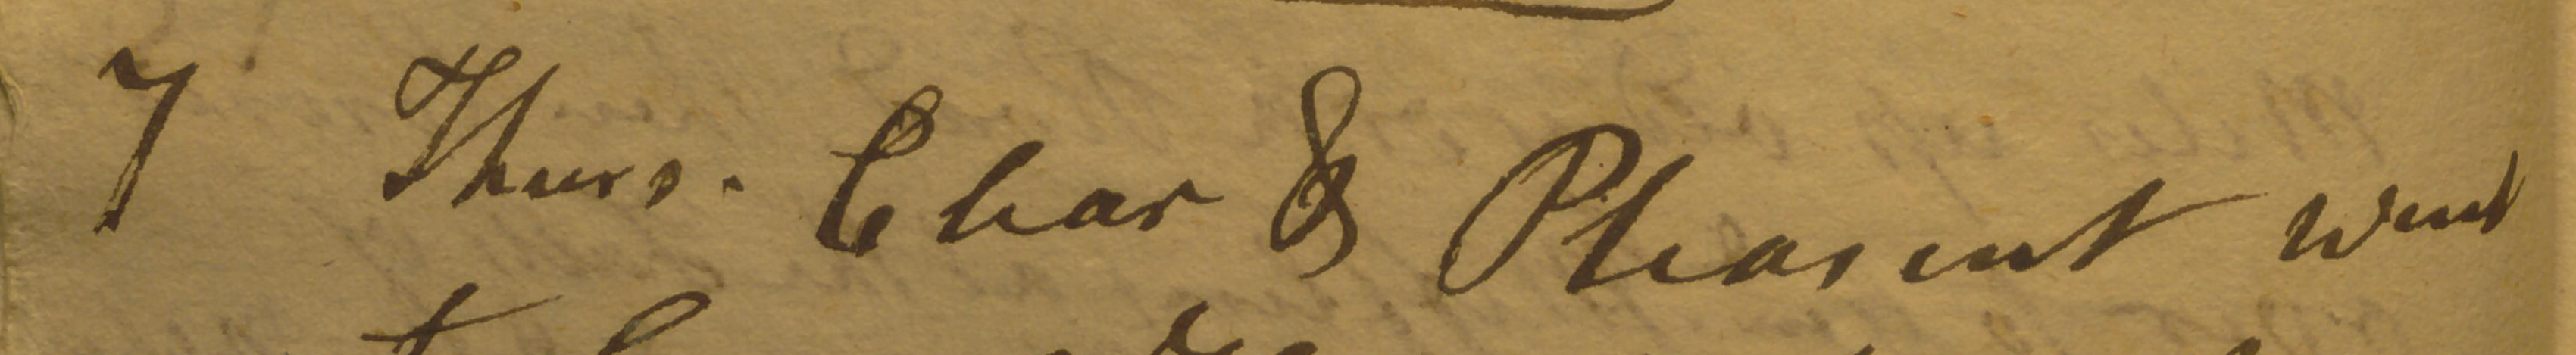7 Thurs. Clear & Pleasent went
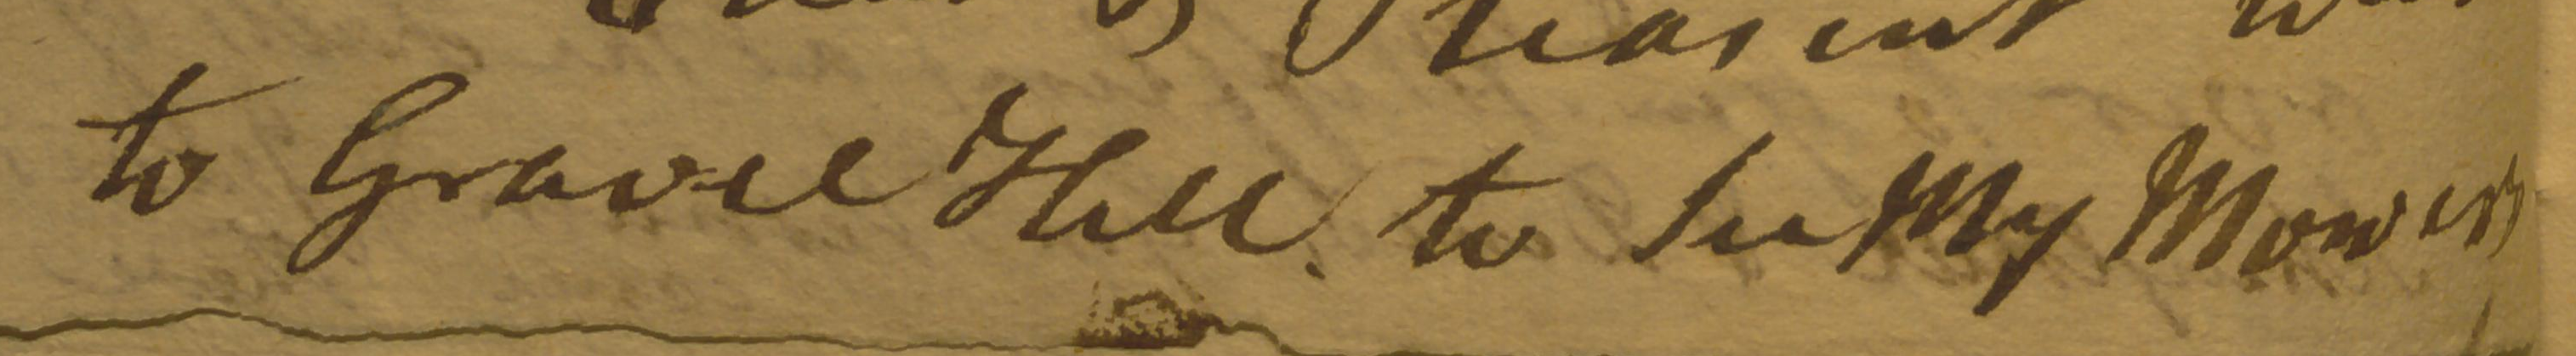to Gravel Hill to see My Mowers
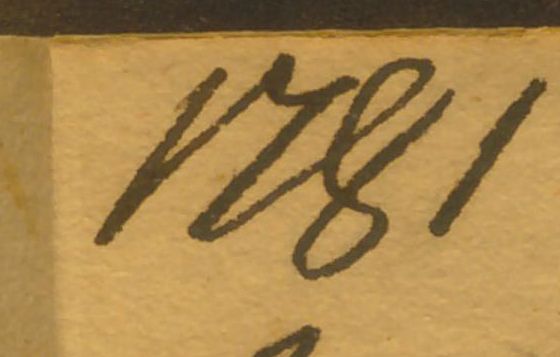1781
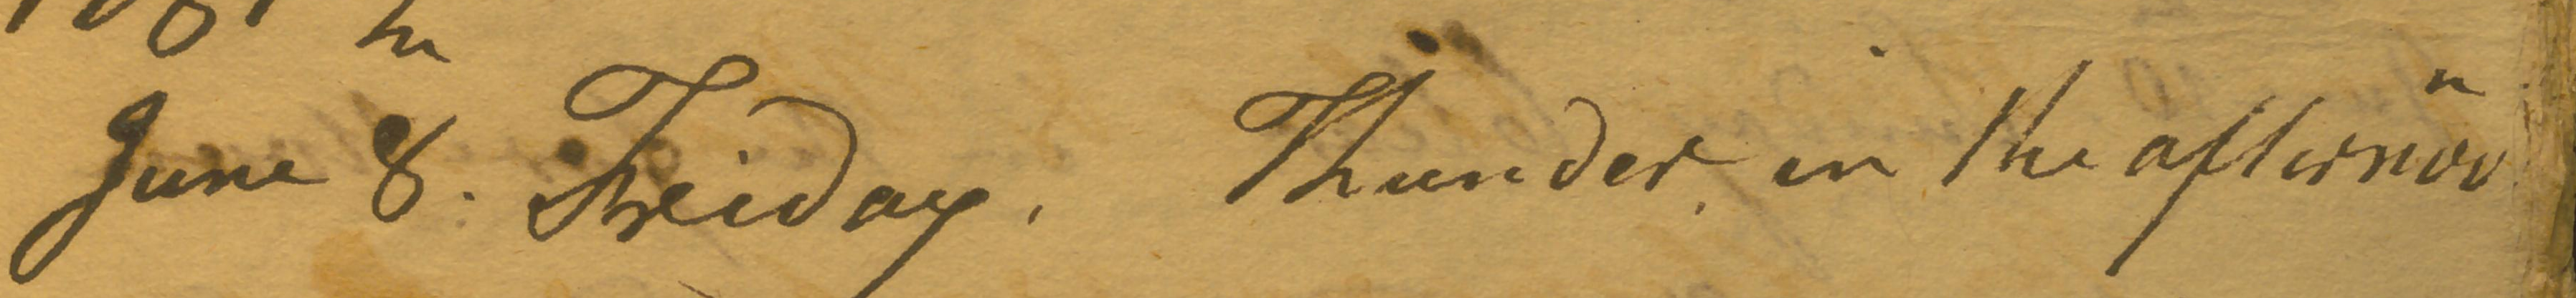June 8th. Friday. Thunder in the afternoo^n
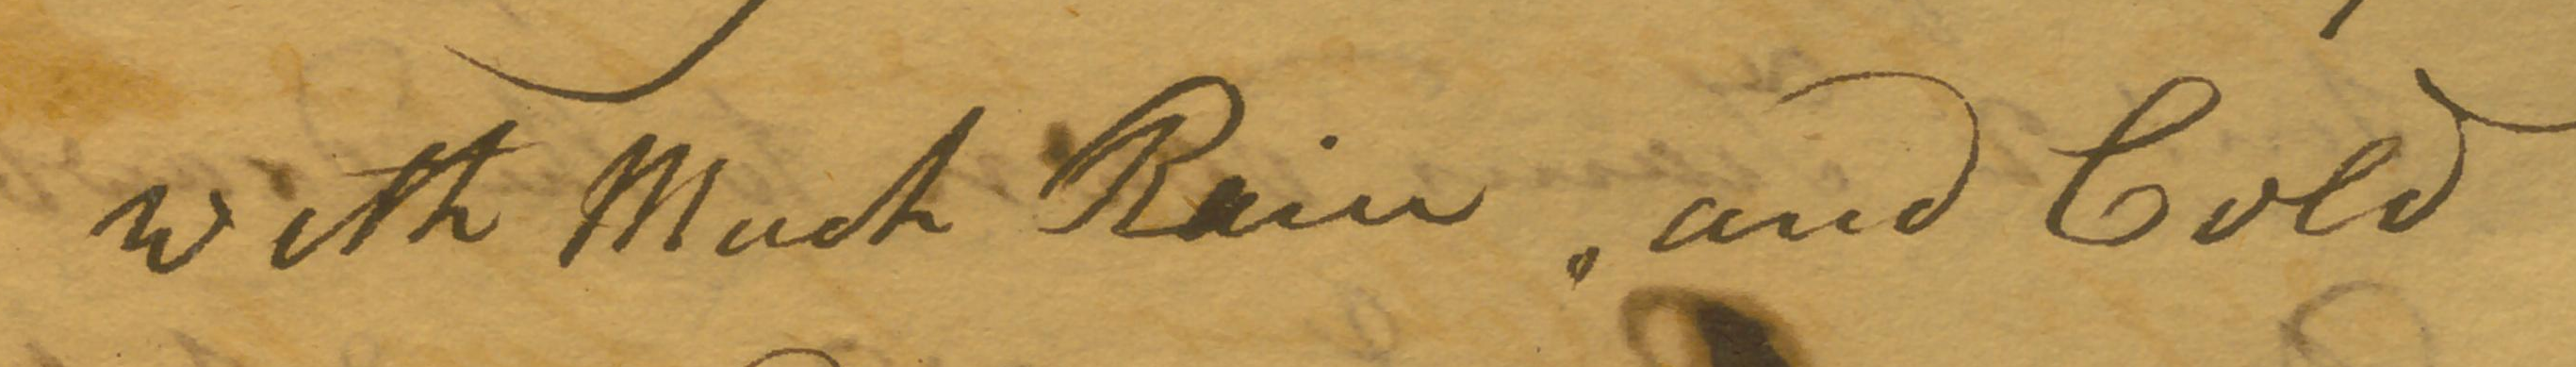with Much Rain and Cold
